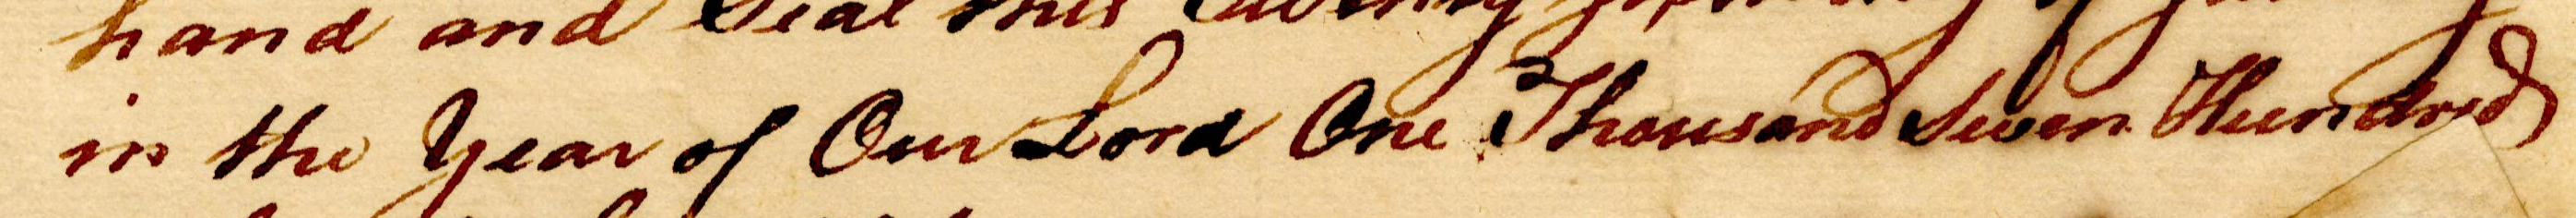in the Year of Our Lord One Thousand Seven Hundred
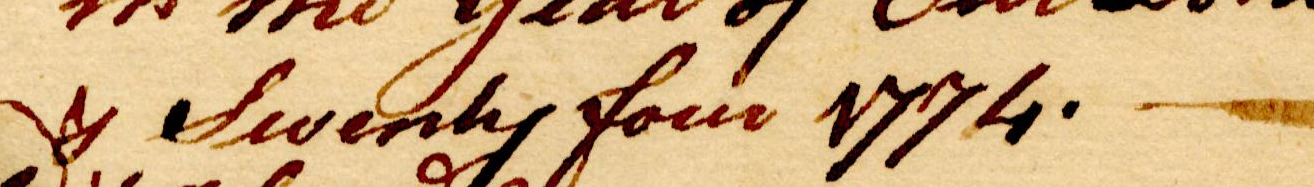& seventy four 1774.
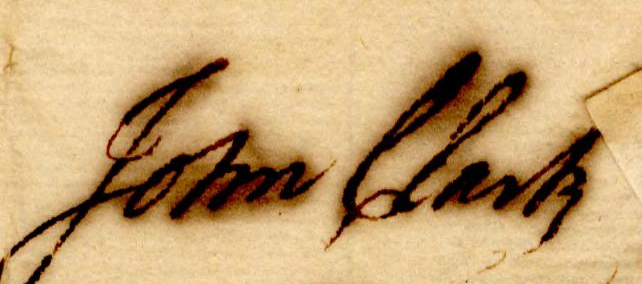John Clark
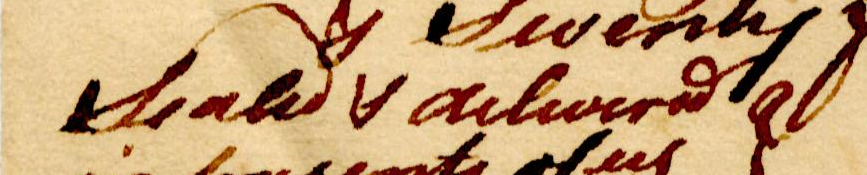Sealed & delivered
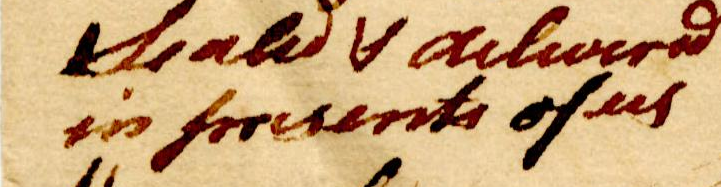In presents of us
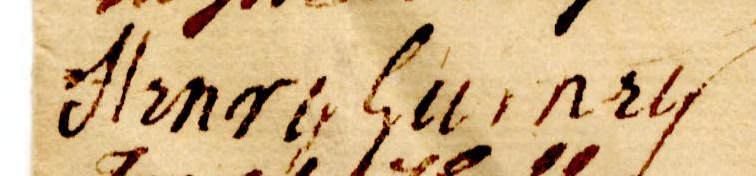Henry Gunry
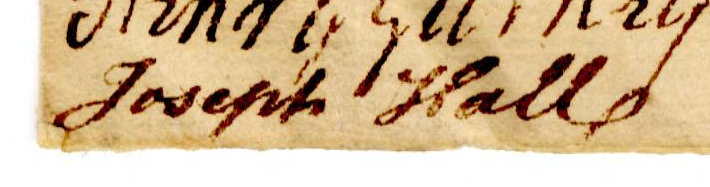Joseph Hall
